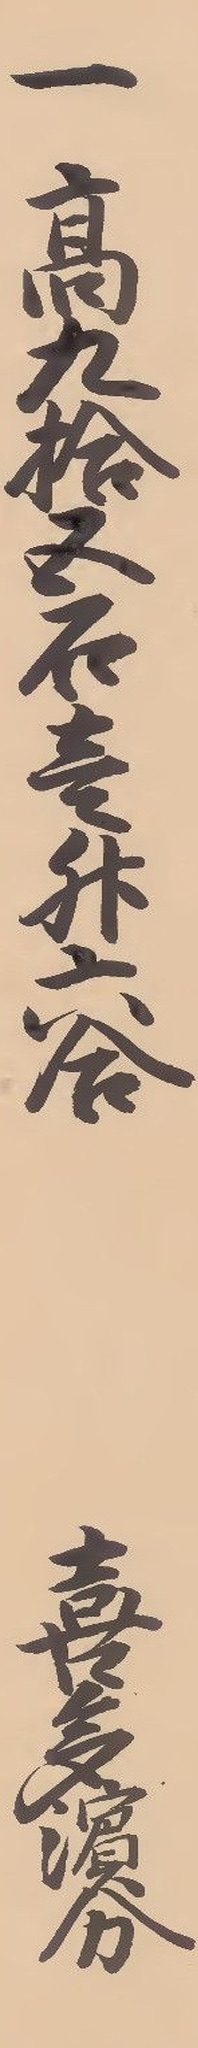一高九拾五石壱升六合喜多浜分

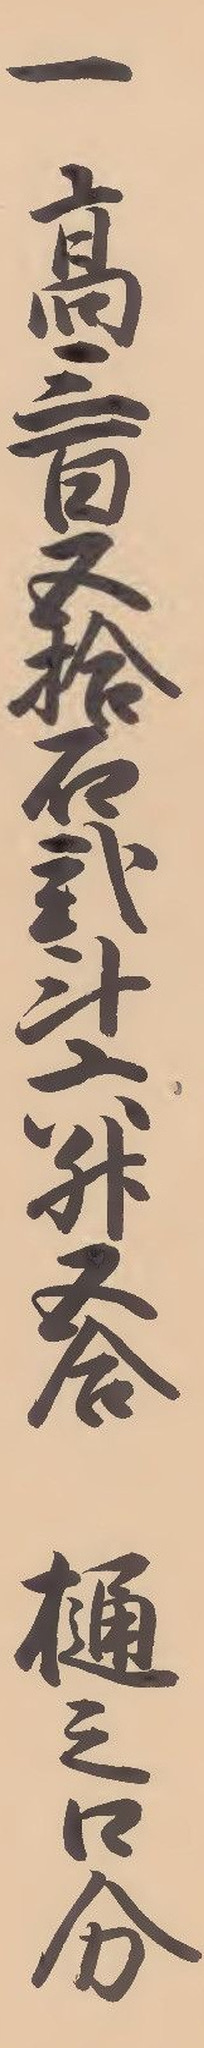一高三百五拾石弐斗六升五合樋之口分
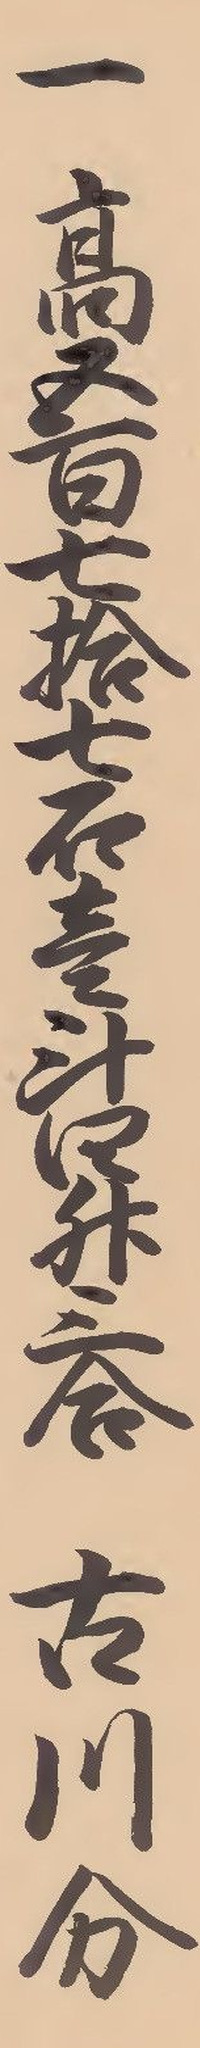一高五百七拾七石壱斗四升三合古川分
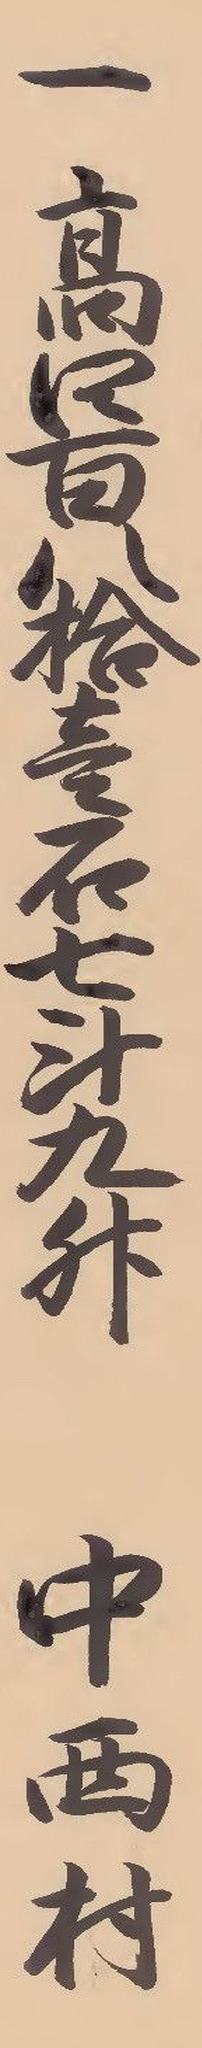一高四百八拾壱石七斗九升中西村
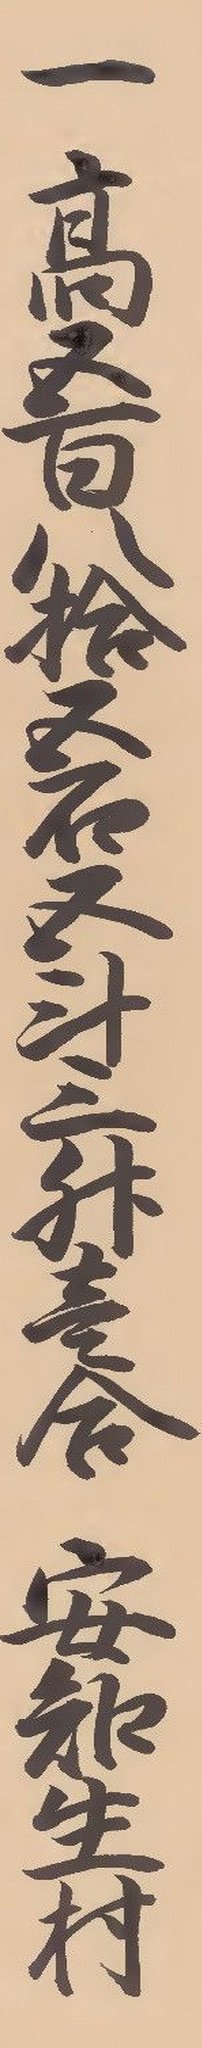一高五百八拾五石五斗三升壱合安知生村
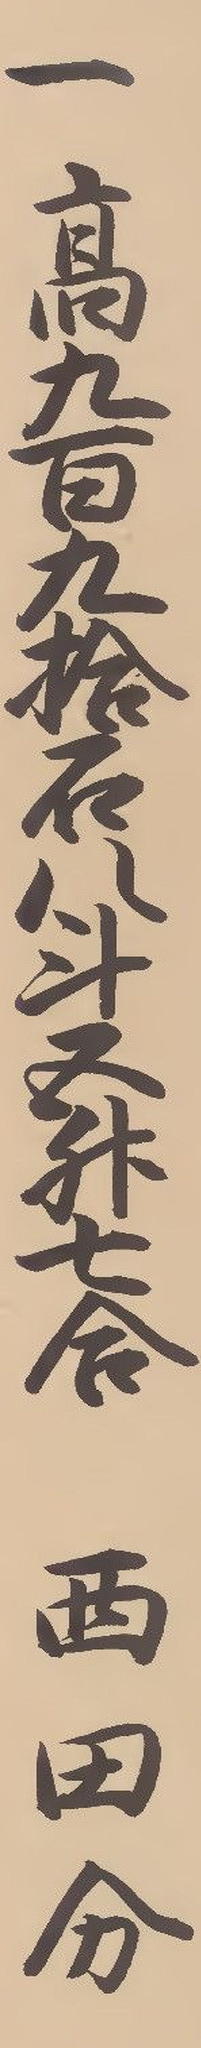一高九百九拾石八斗五升七合西田分
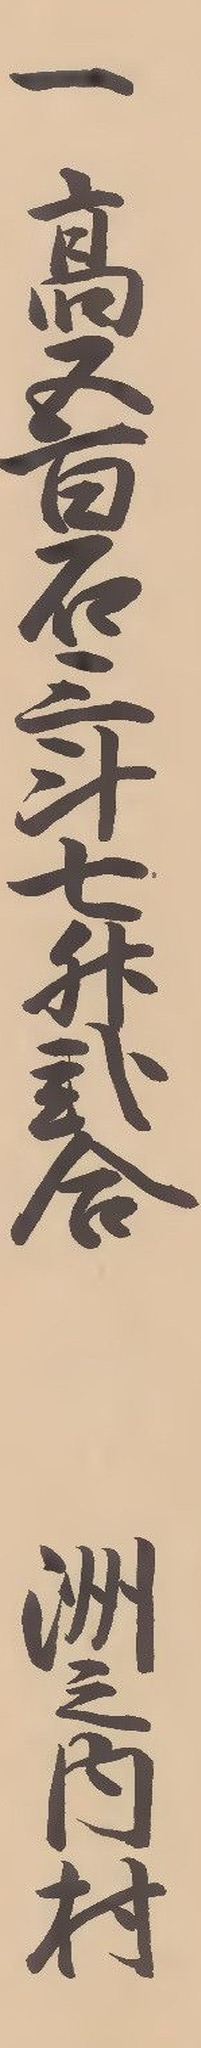一高五百石三斗七升弐合洲之内村
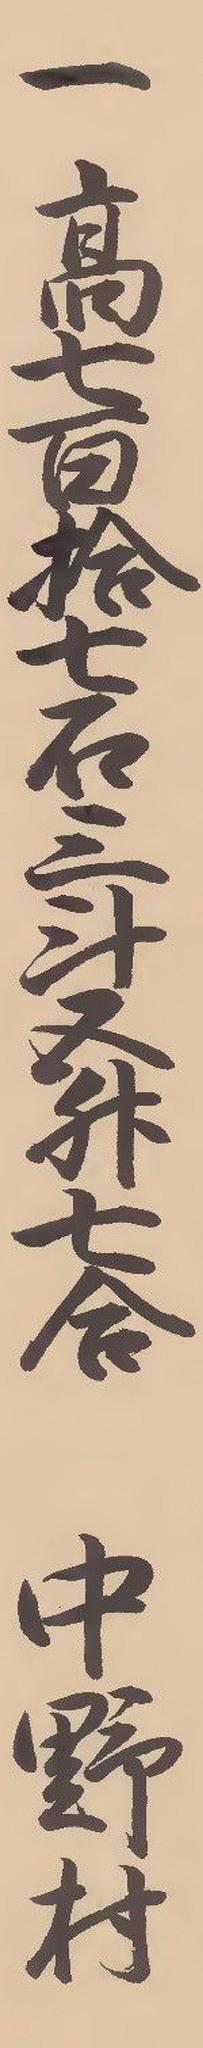一高七百拾七石三斗五升七合中野村
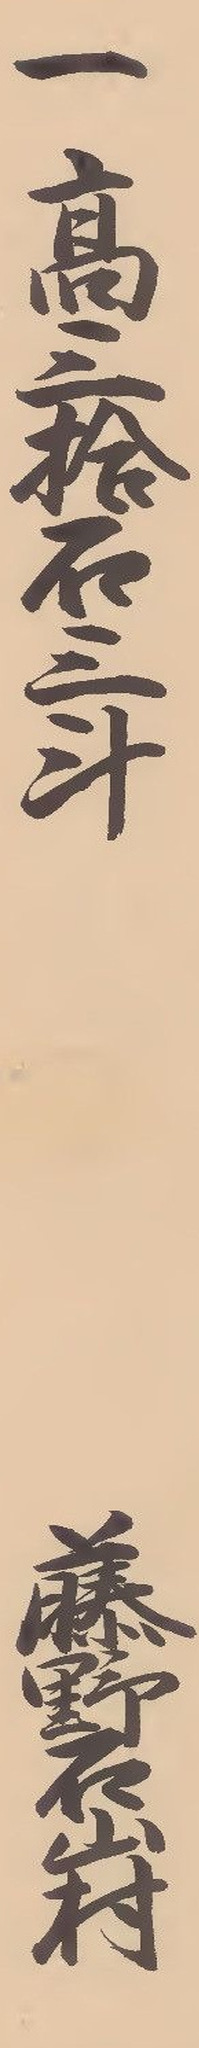一高三拾石三斗藤野石山村

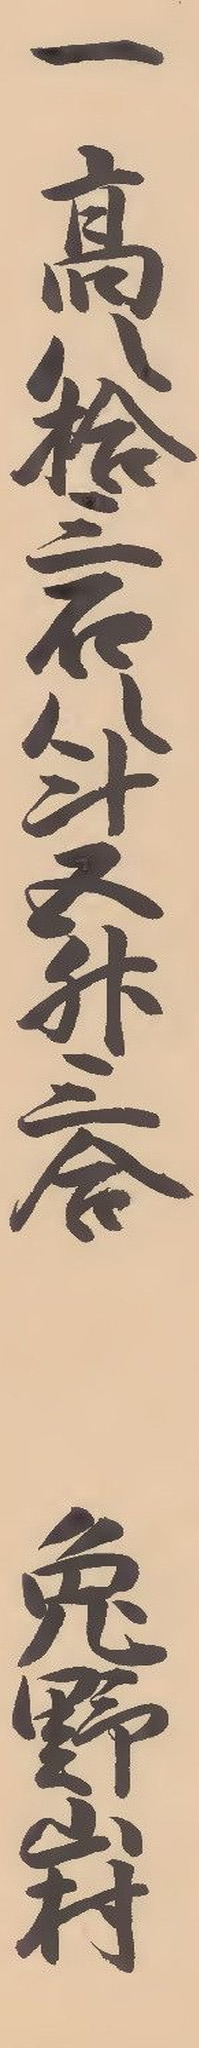一高八拾三石八斗五升三合兎野山村
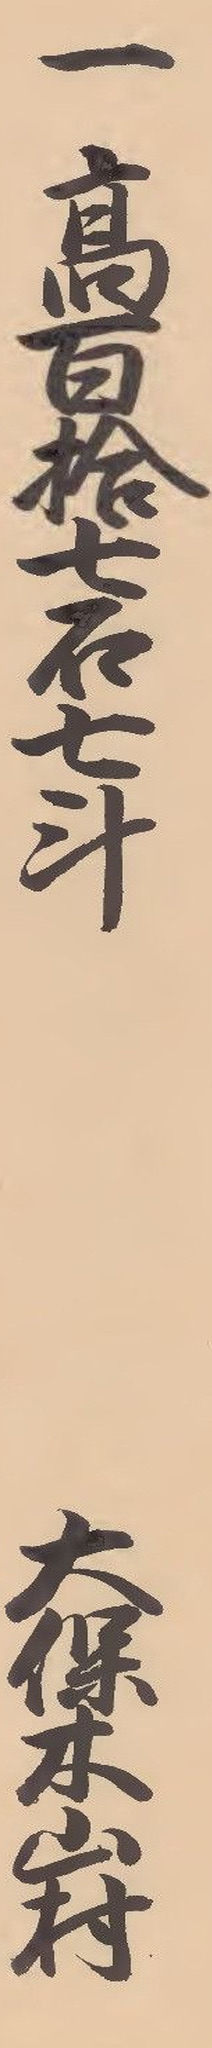一高百拾七石七斗大保木山村
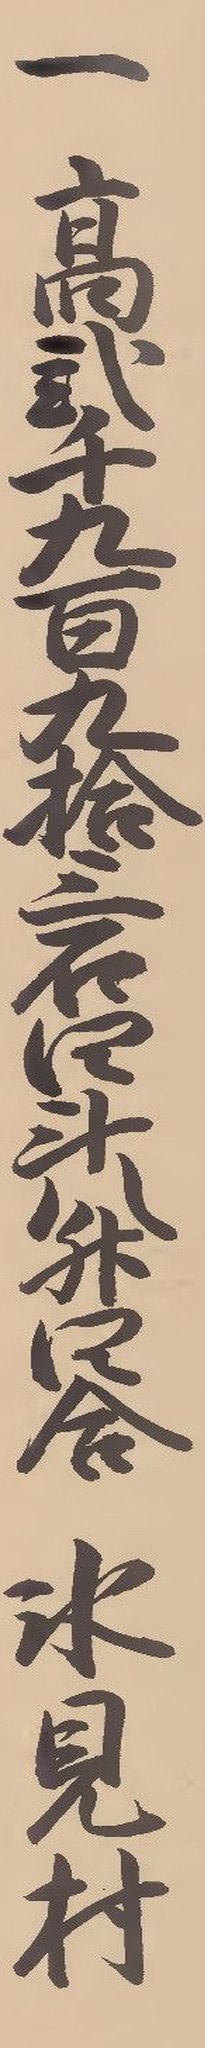一高弐千九百九拾三石四斗八升四合氷見村

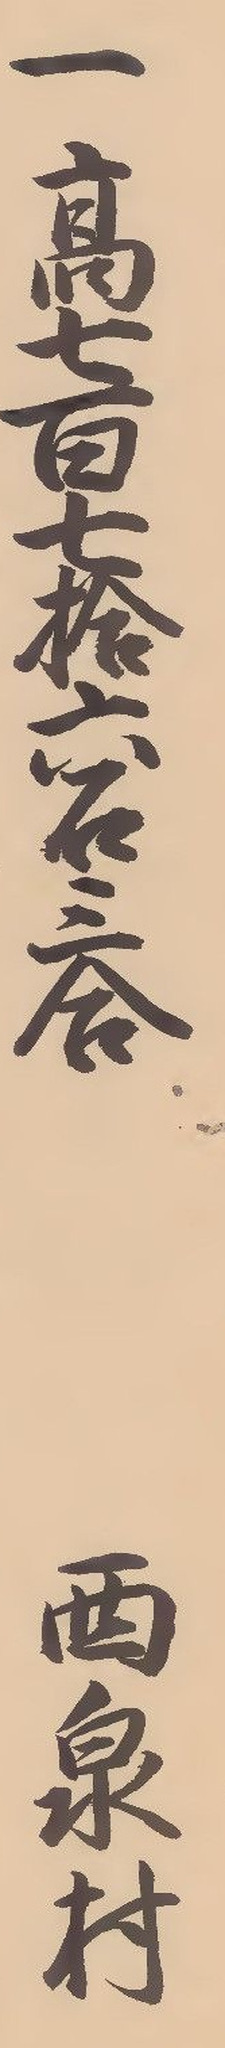一高七百七拾六石三合西泉村
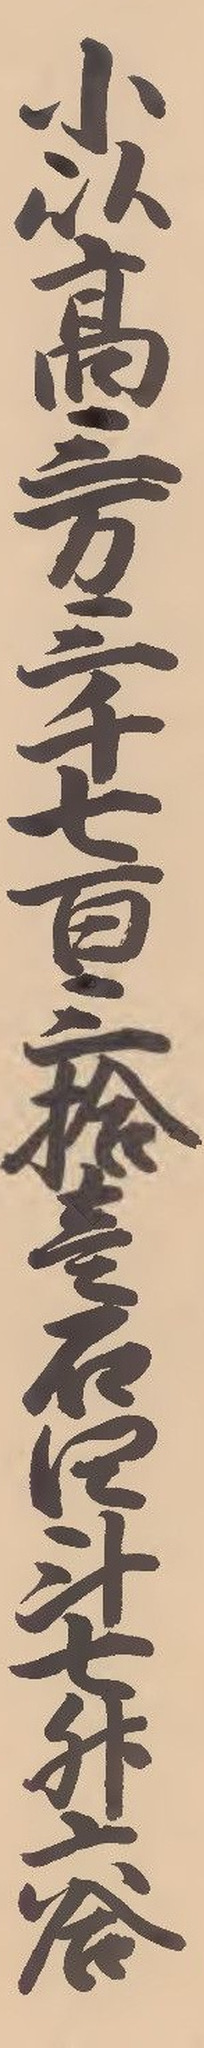小以高三万三千七百三拾壱石四斗七升六合
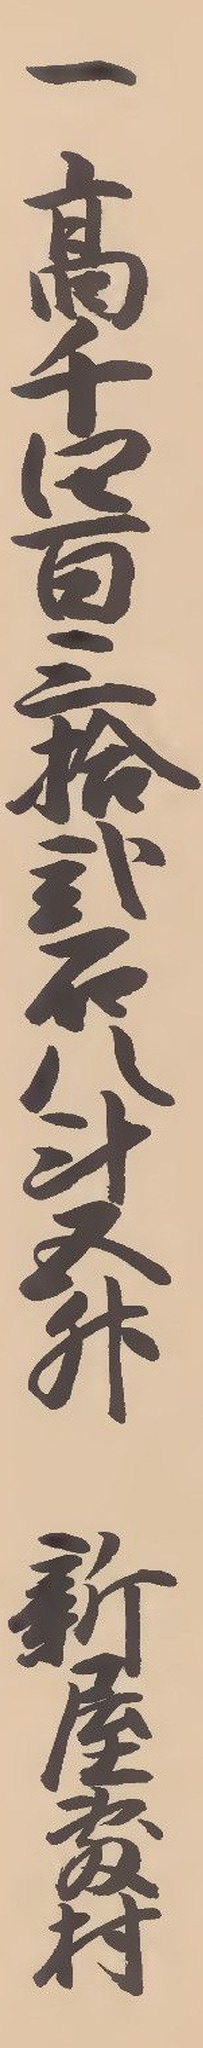一高千四百三拾弐石八斗五升新屋敷村
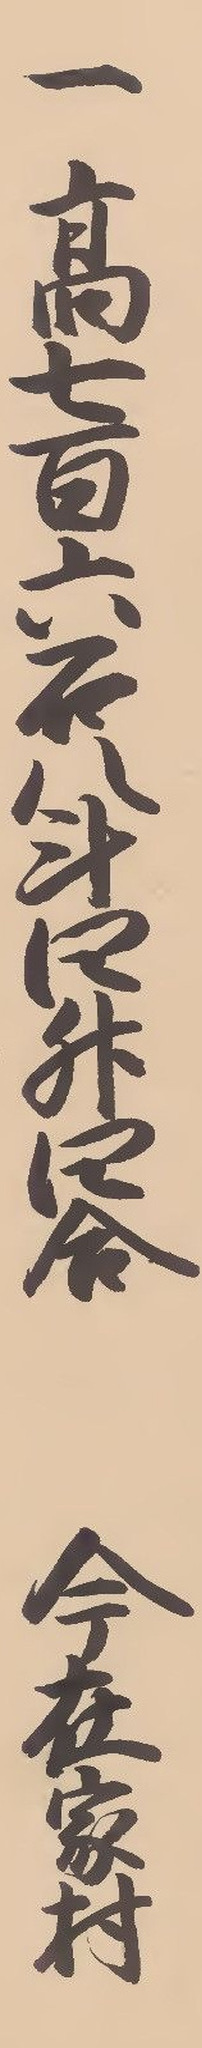一高七百六石八斗四升四合今在家村
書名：伊予国郷帳
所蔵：国立公文書館 National Archives of Japan
